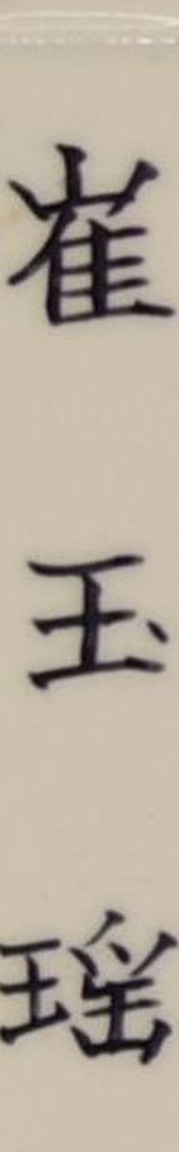崔玉瑶

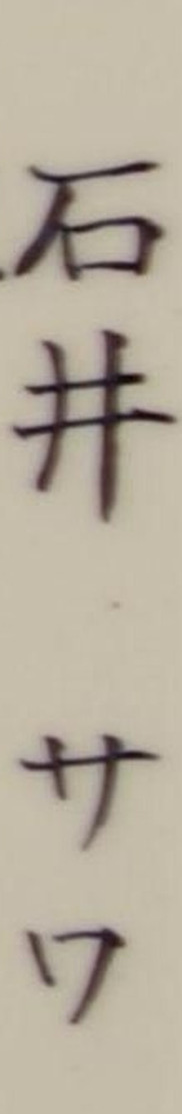石井サワ
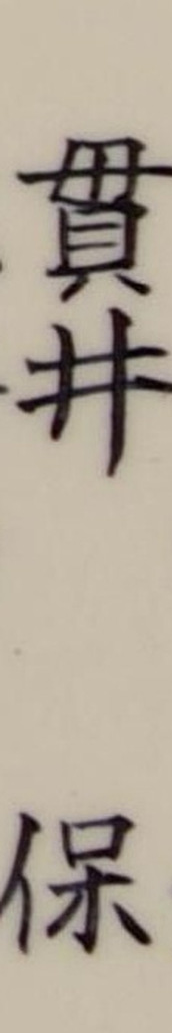貫井保
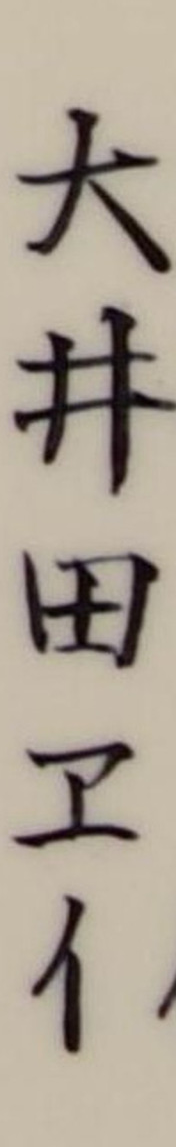大井田エイ
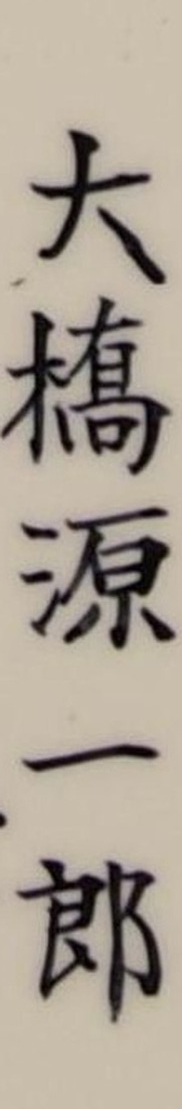大橋源一郎
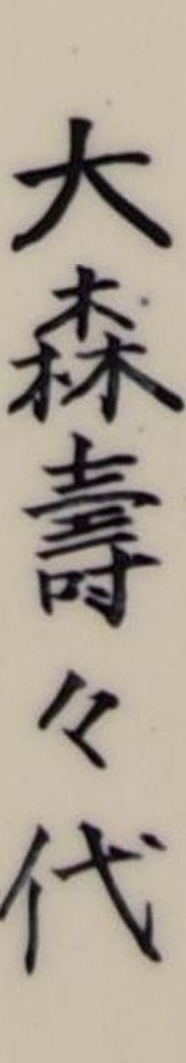大森壽々代
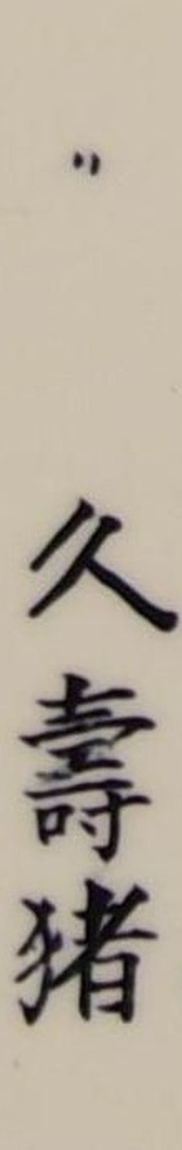久壽猪
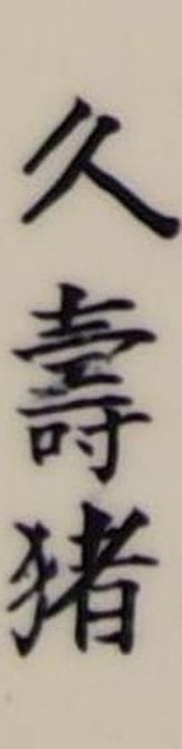久壽猪
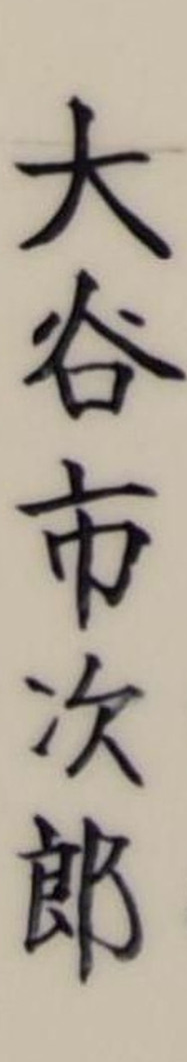大谷市次郎
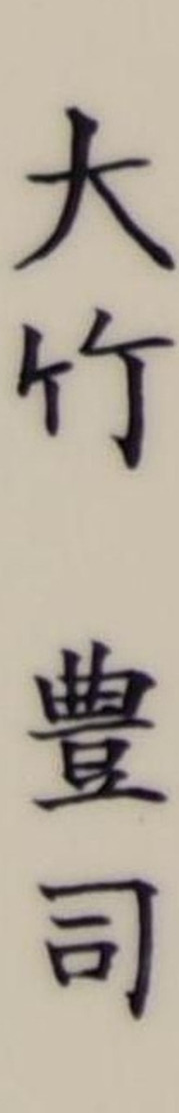大竹豊司
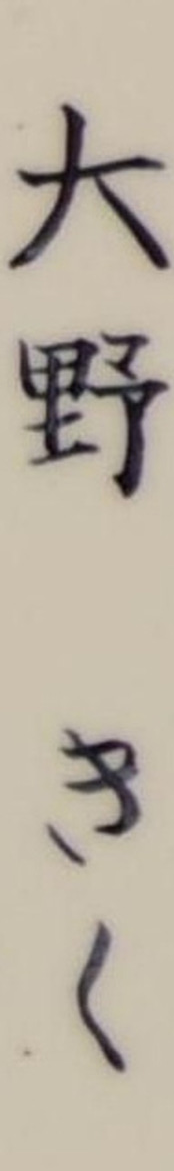大野きく
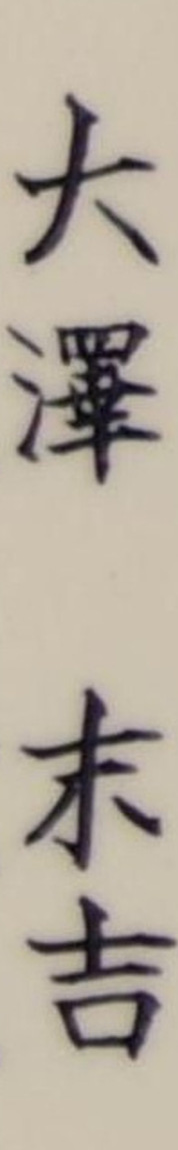大澤末吉
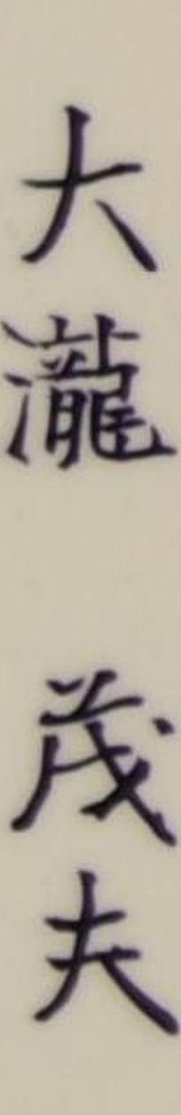大瀧茂夫
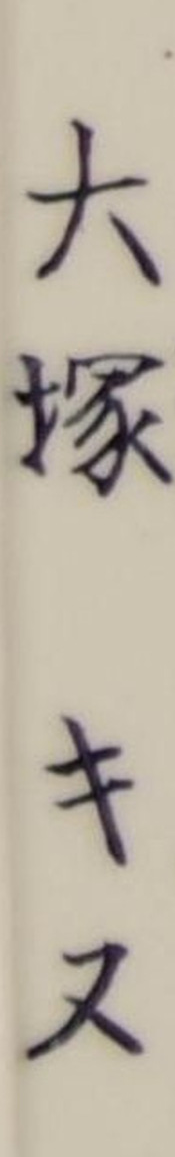大塚キヌ

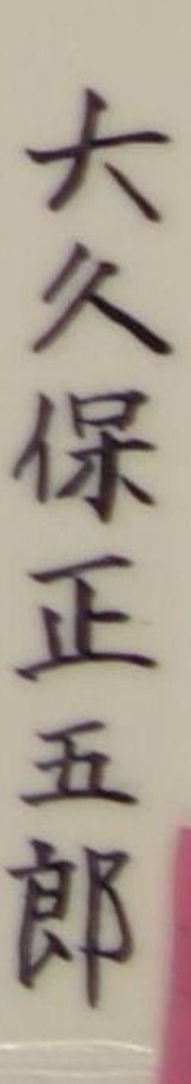大久保正五郎
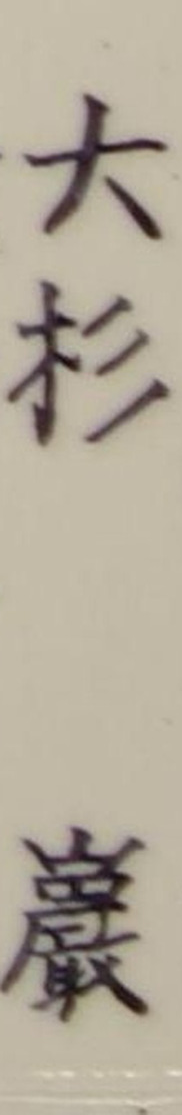大杉巌
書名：E~L
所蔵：高野山金剛峯寺
